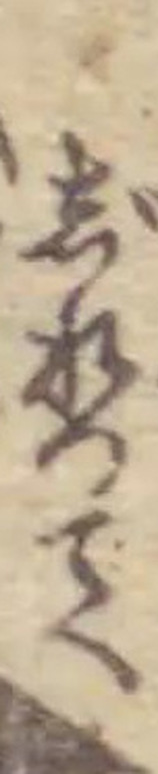じれつてへ

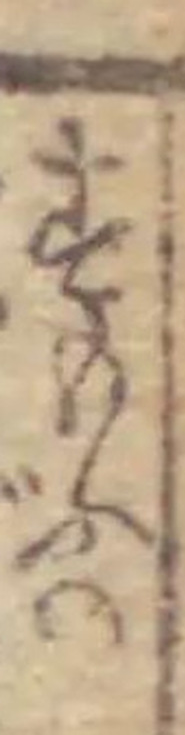すもふの
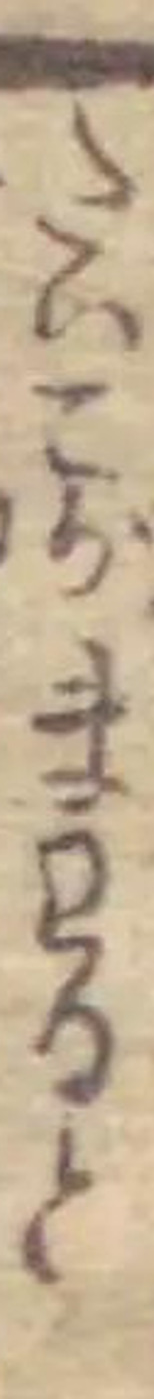たいこがまわると
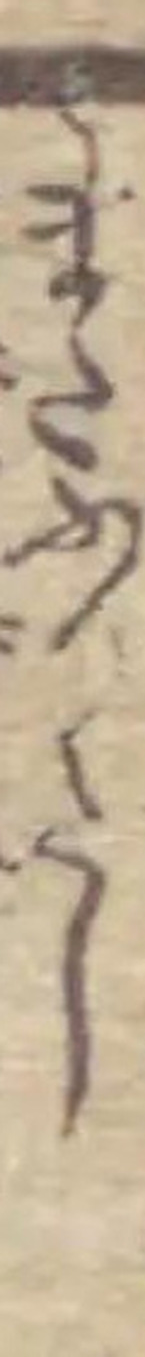またふりたし
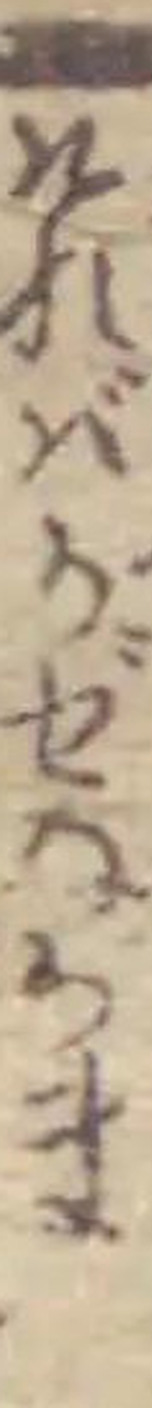ければかぜなかま
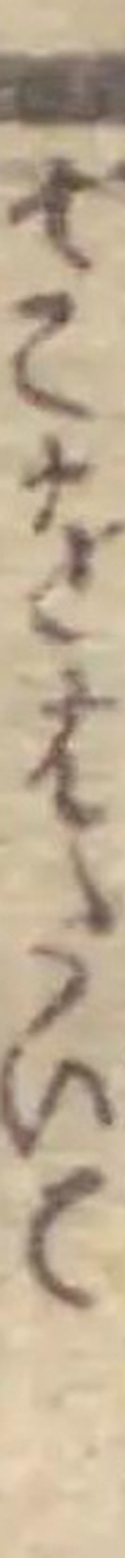そこをはたいて
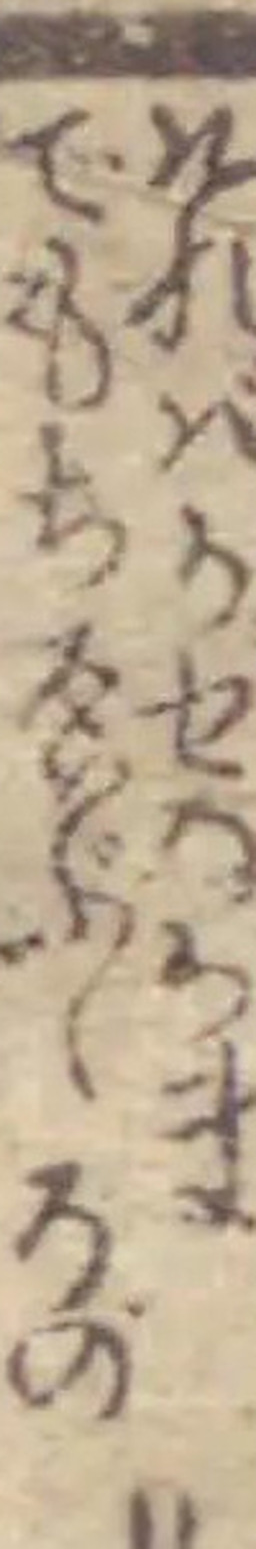でもちゑぶくろの
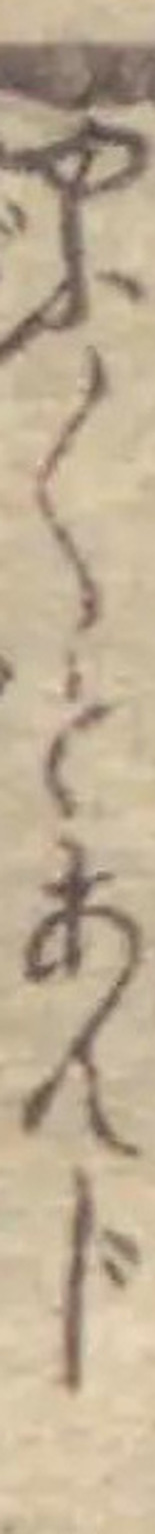やふ〳〵とあんじ
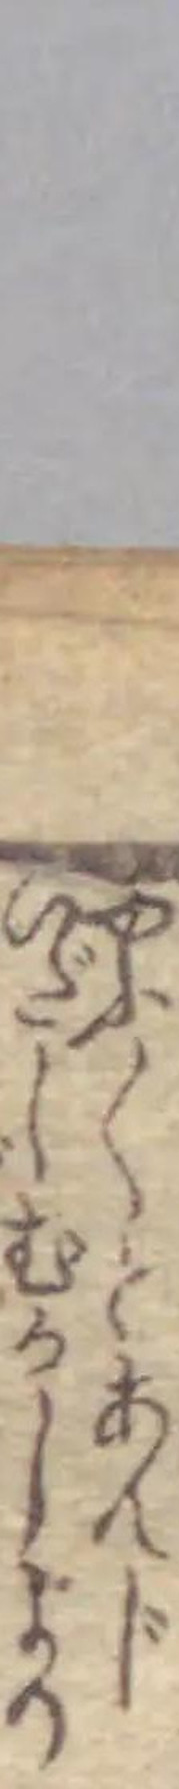いだしむかしより
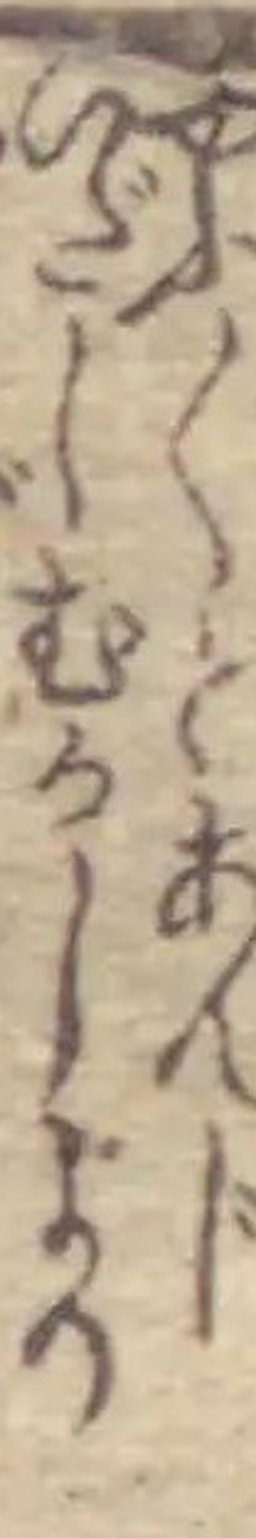いだしむかしより
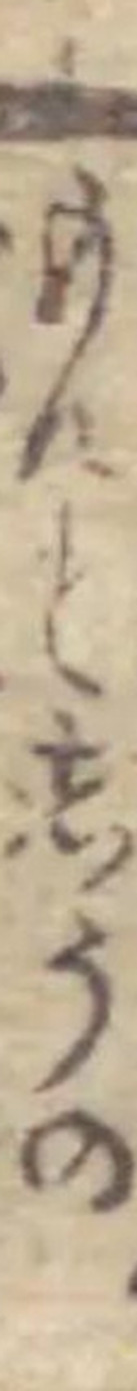もんとしうの
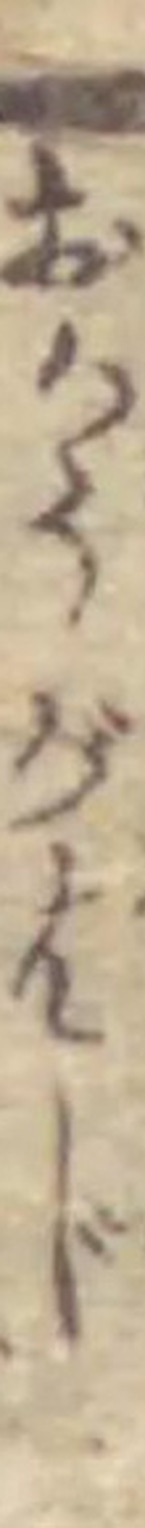おかうがはじ
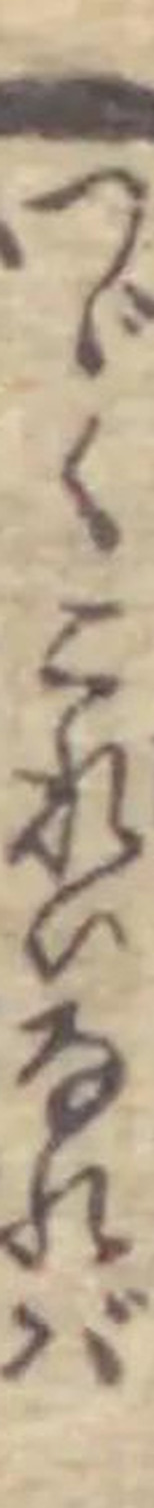つゞくこれいなれば
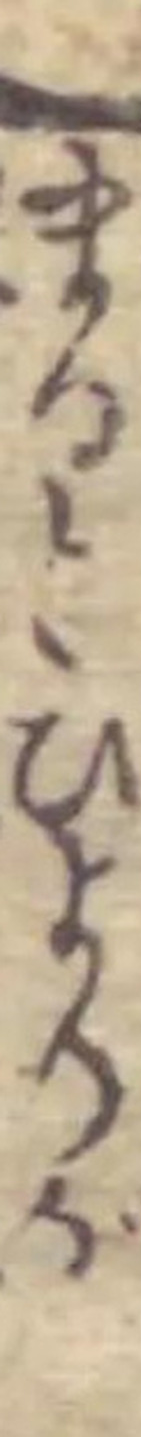まるとひよりが
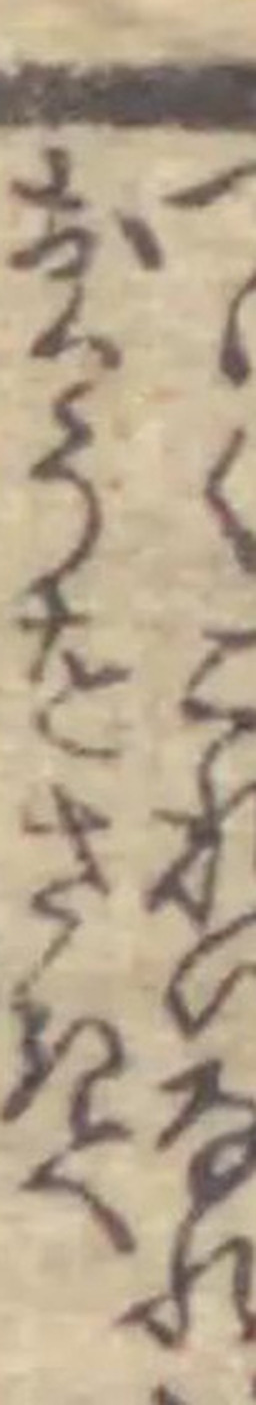おかうをさきへ
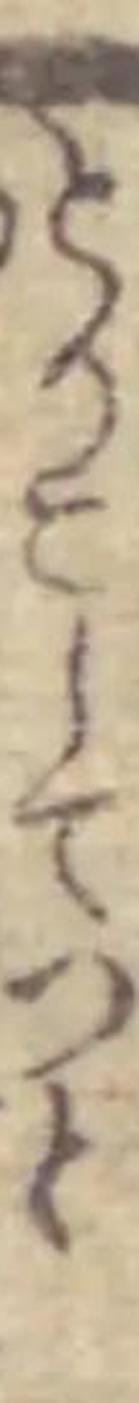とりこしてつと
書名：雨宮風宮出儘略縁記 3巻
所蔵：国立国会図書館 National Diet Library, JAPAN
